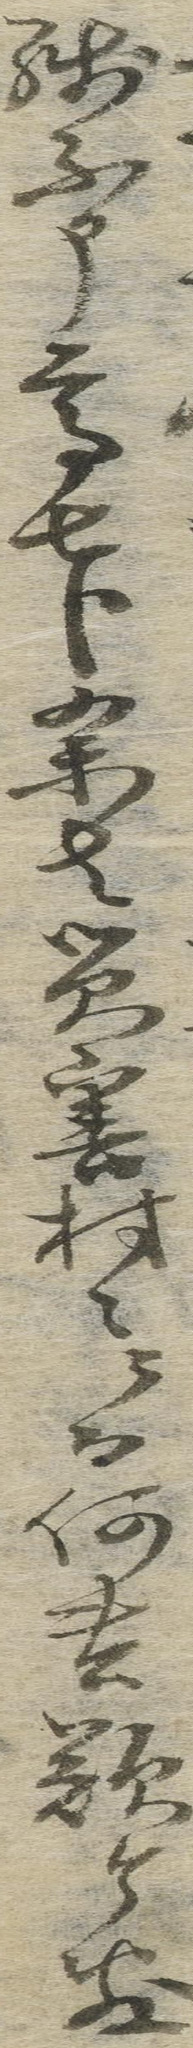残不申高七分余は災害村々二而何共嘆ヶ敷
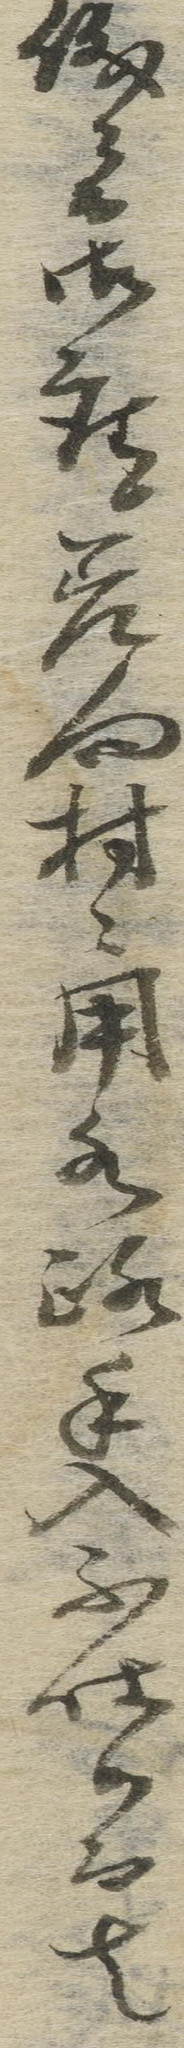儀二而御座候差向村々用水路手入不仕候而は

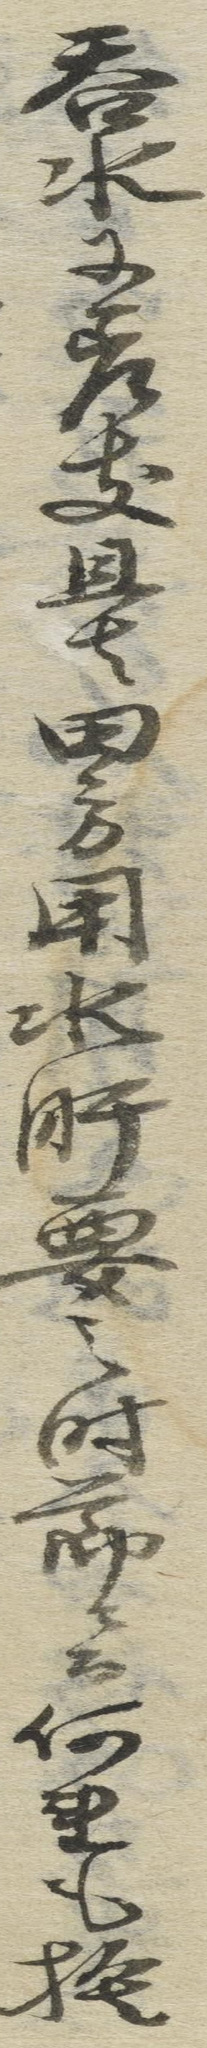呑水に差支且は田方用水肝要之時節二而何れも捨
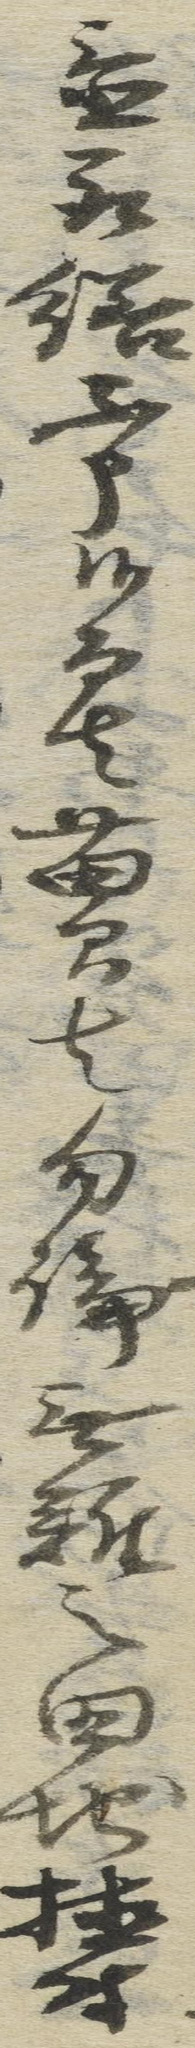置取繕不申候而は苗間は勿論無難之田畑植付
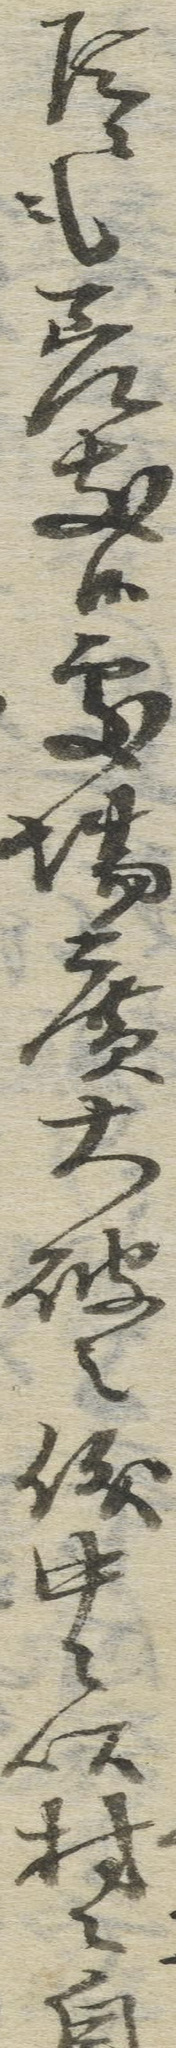候二も差支候処場廣大破之儀中々以村々自
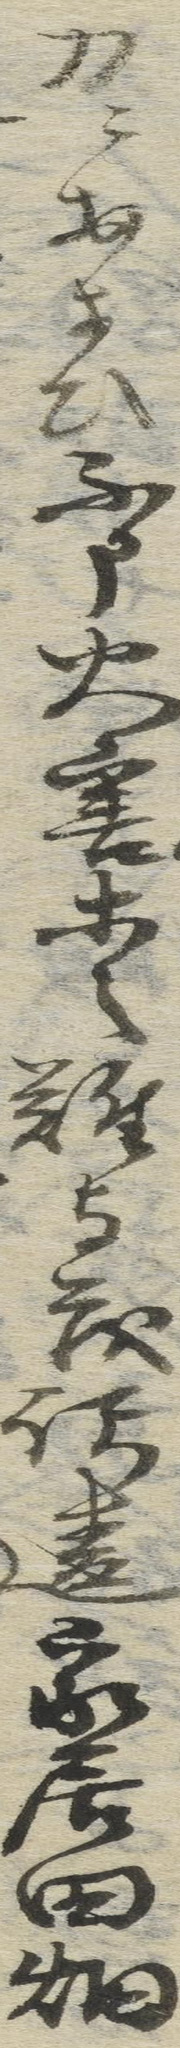力二およひ不申火害等之難とも訳違家居田畑
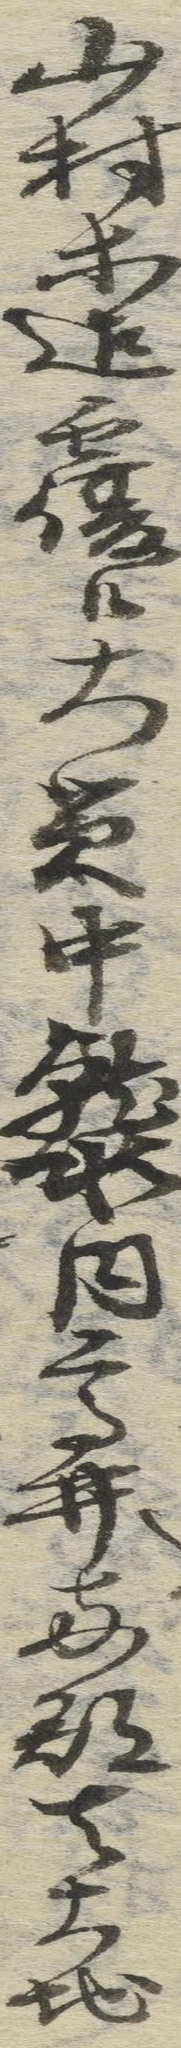山林等迄覆候大災中就水内高井両郡は大地
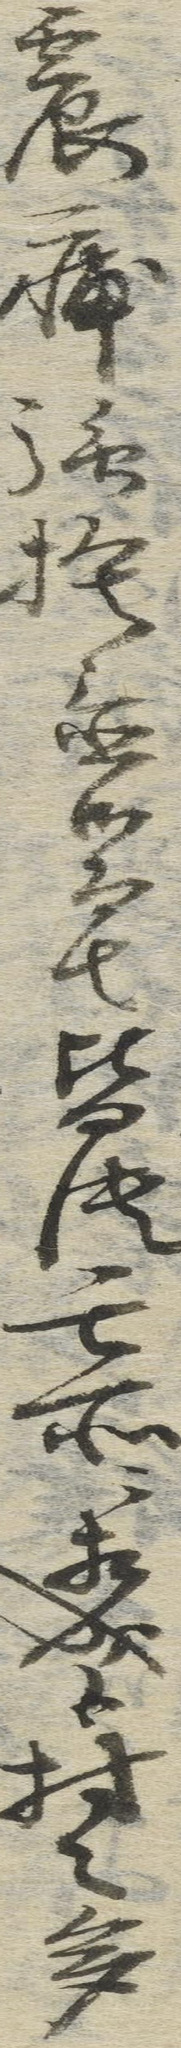震痛強捨置候候而は皆潰亡所二相成候村々多
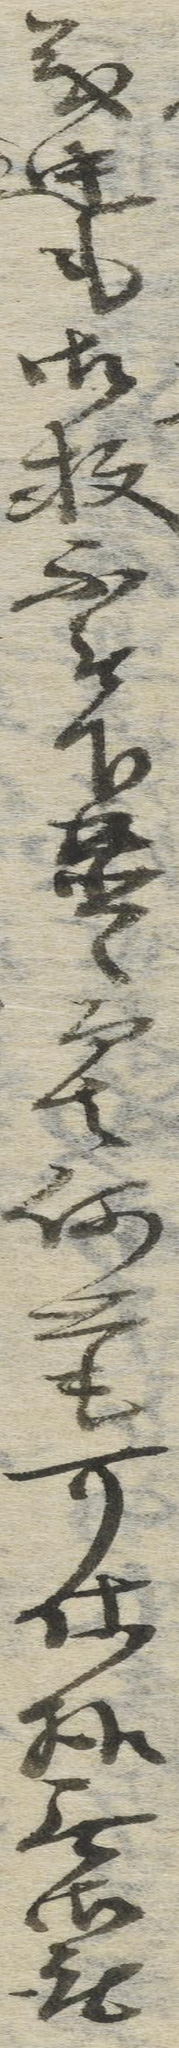儀迚も御救不被下置候而ハ者は何とも可仕様無御座
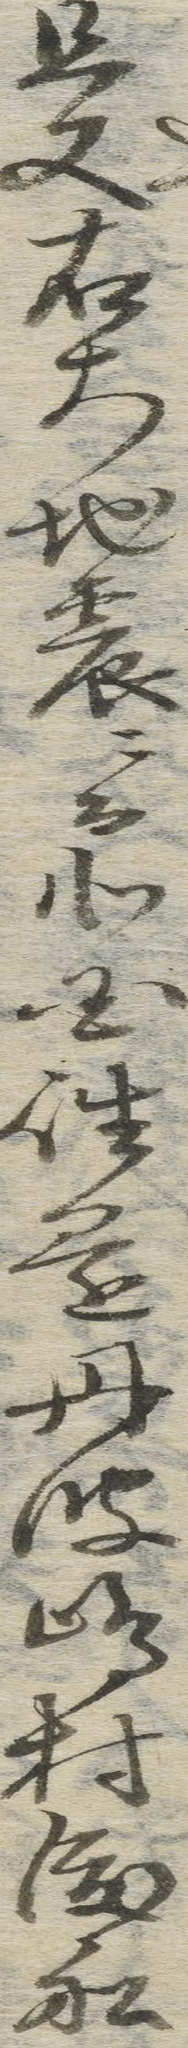且又右大地震二而北国往還丹波嶋村渡船
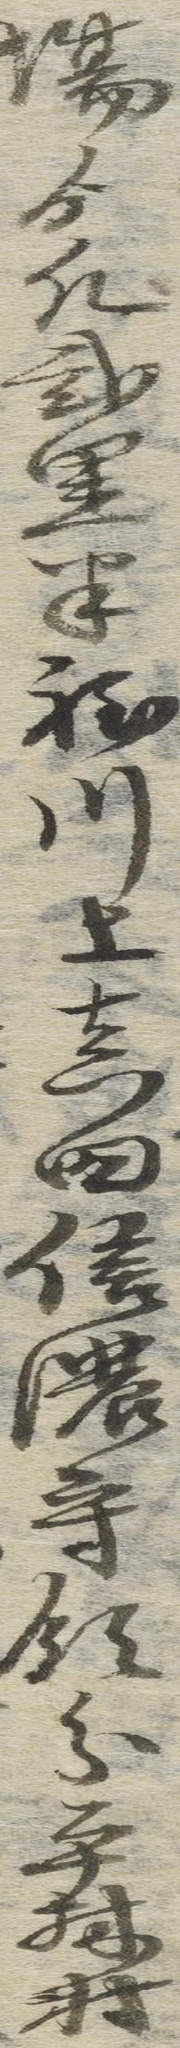場ゟ凡二里半程川上真田信濃守領分平林村
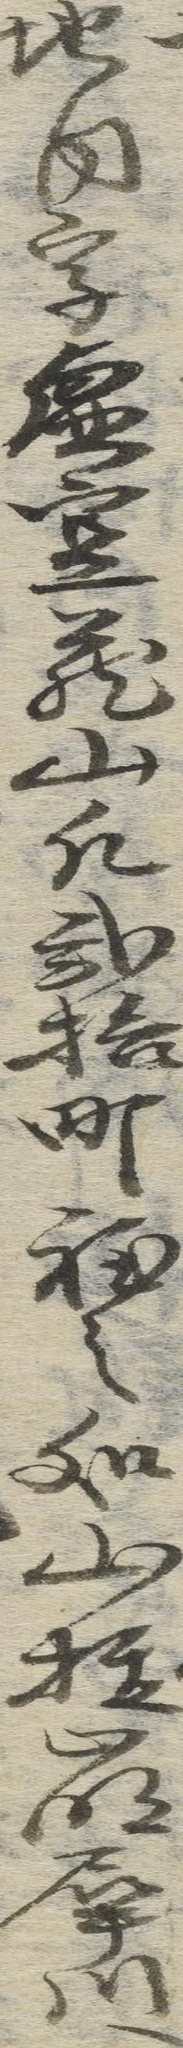地内字虚空蔵山凡弐拾町程之処山抜崩犀川へ
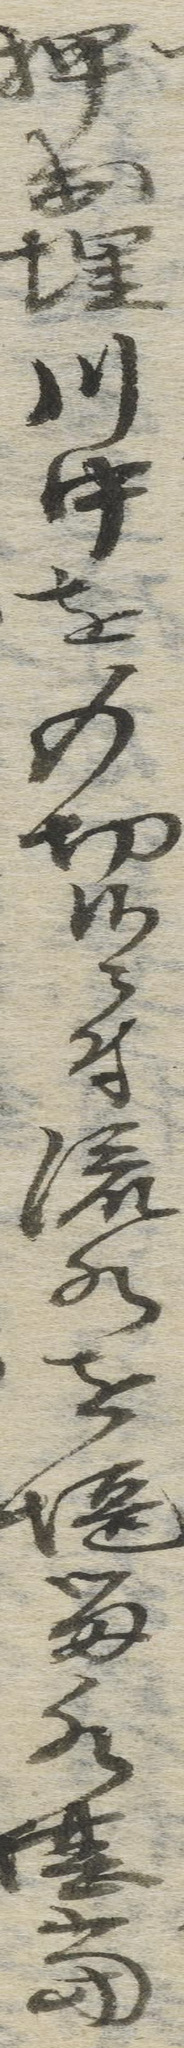押出埋川中を〆切候二付流水を堰留水湛当
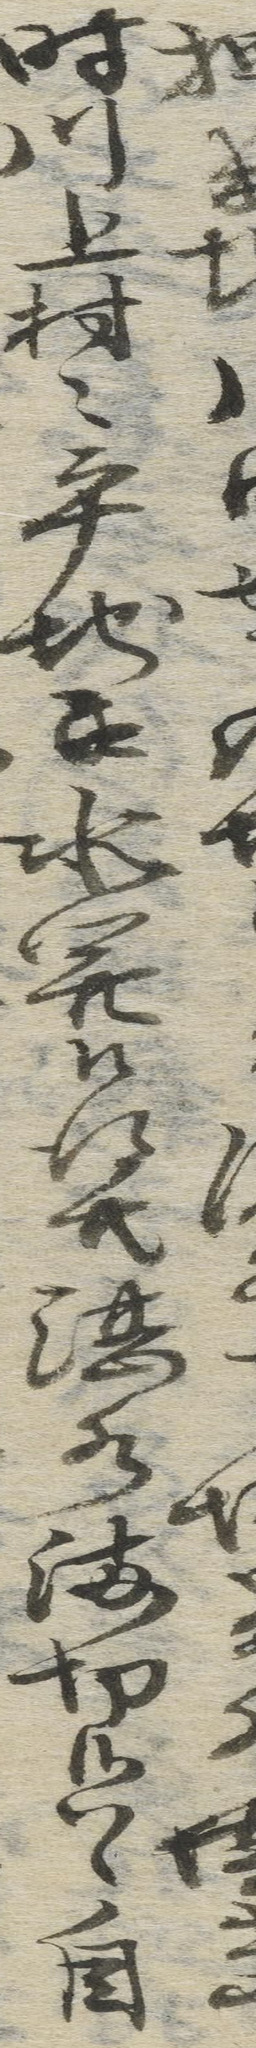時川上村々平地江水開候得共湛水留切候ハゝ自
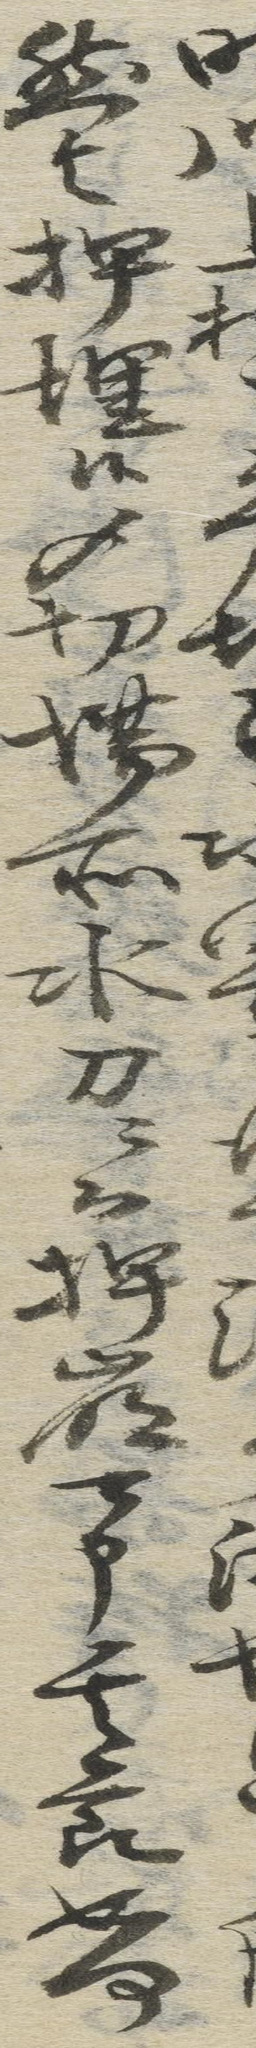然と押埋候〆切場所水力二而押崩可申其節如何
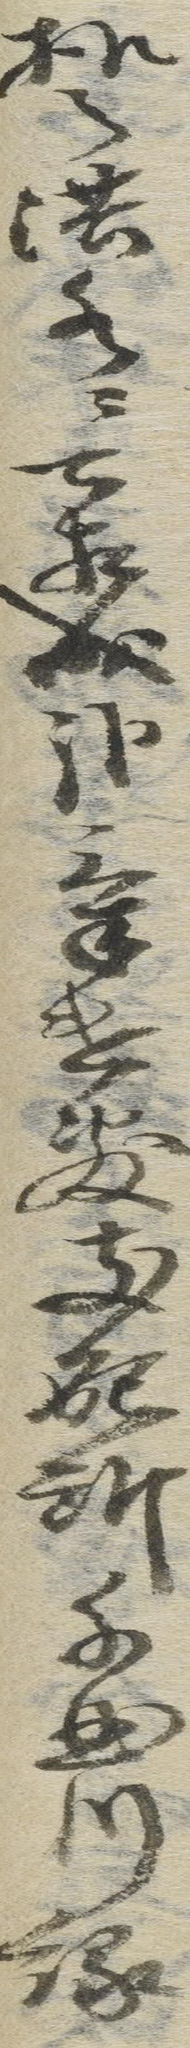様之洪水二可相成哉気遣敷支配所千曲川縁
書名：信濃越後　地震書留
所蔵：東京大学地震研究所図書室 Earthquake Research Institute Library, The University of Tokyo, JAPAN
